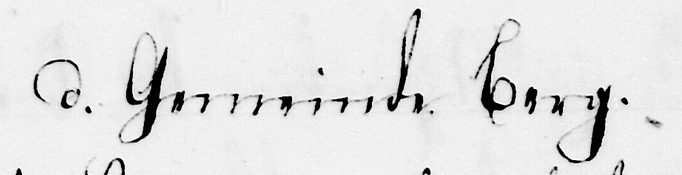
d. Gemeinde Berg.
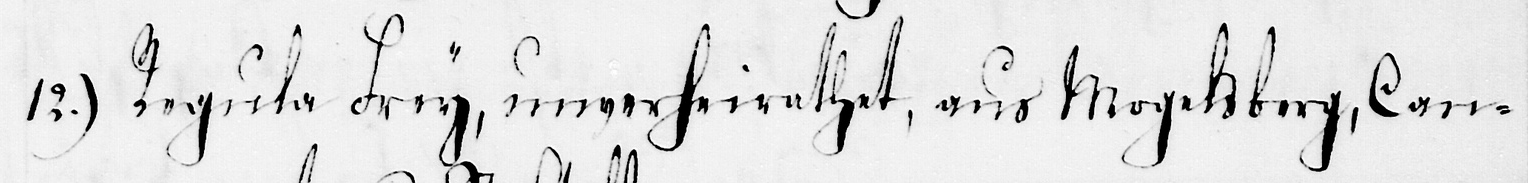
12.) Regula Frey, unverheirathet, aus Mogelsberg, Can¬
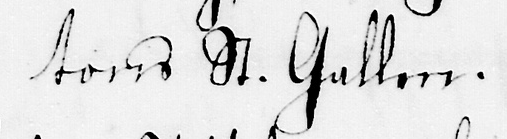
tons St. Gallen.
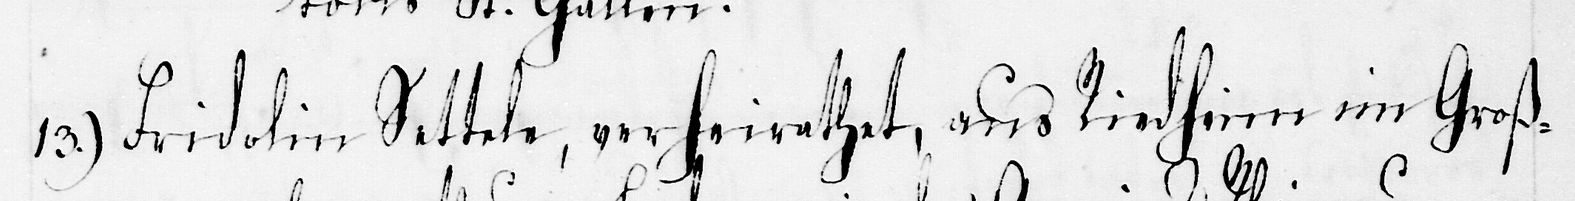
13.) Fridolin Settele, verheirathet, aus Riedheim im Groß¬
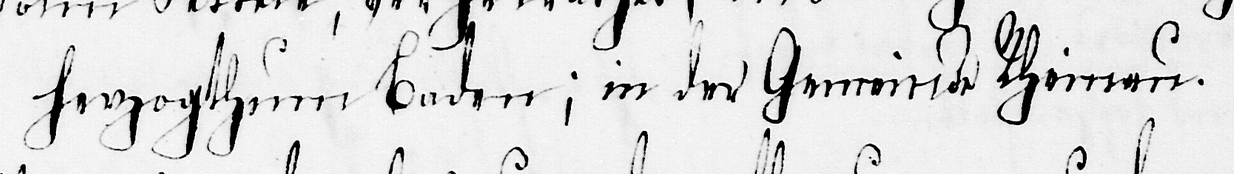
herzogthum Baden; in der Gemeinde Rheinau.
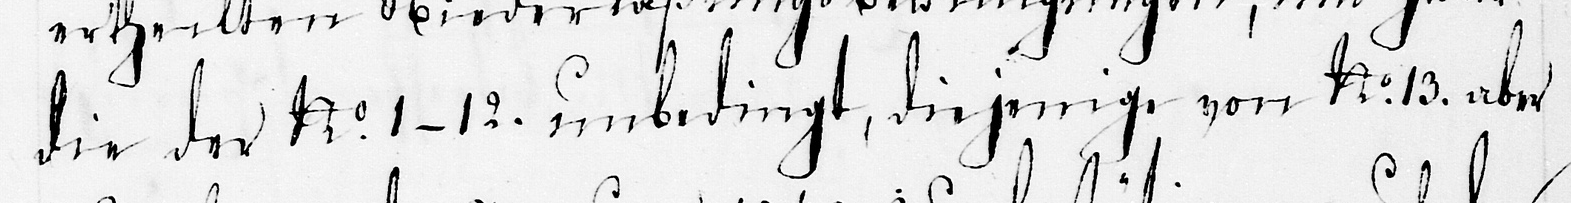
die der No. 1–12. unbedingt, diejenige von No. 13. aber
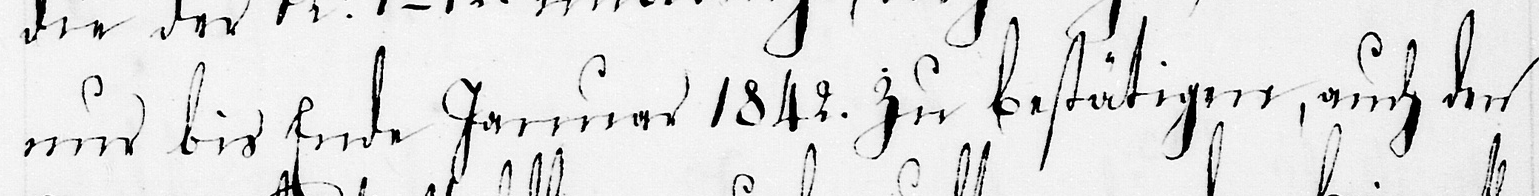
nur bis Ende Januar 1842. zu bestätigen, auch den
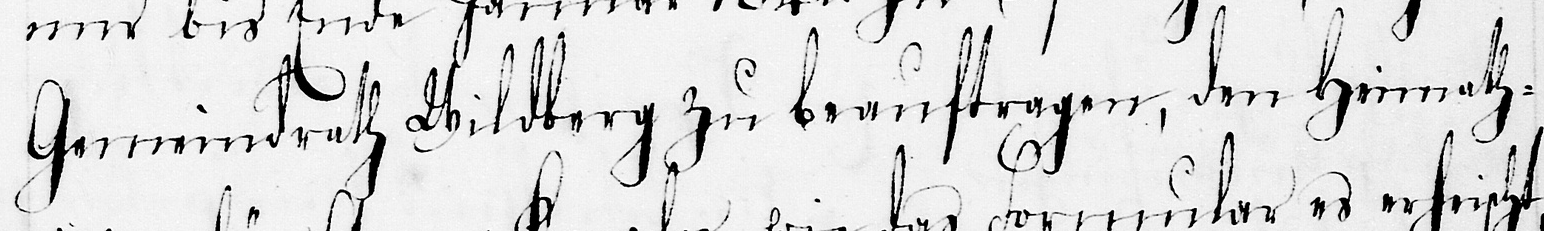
Gemeindrath Wildberg zu beauftragen, den Heimath¬
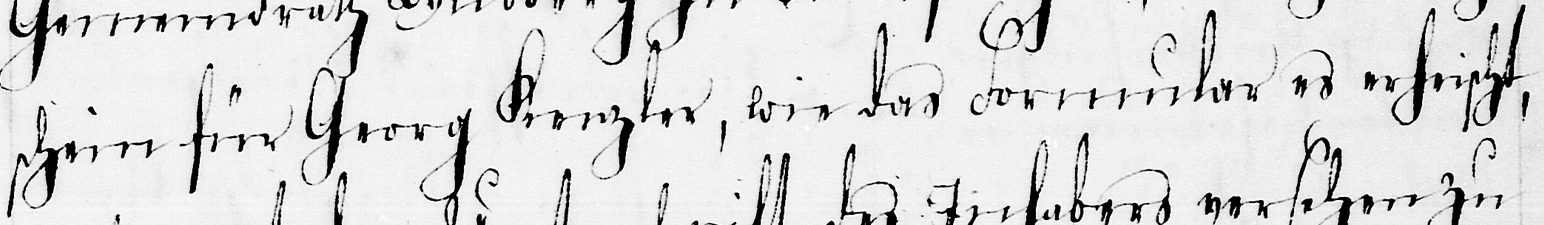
schein für Georg Kenzler, wie das Formular es erheischt,
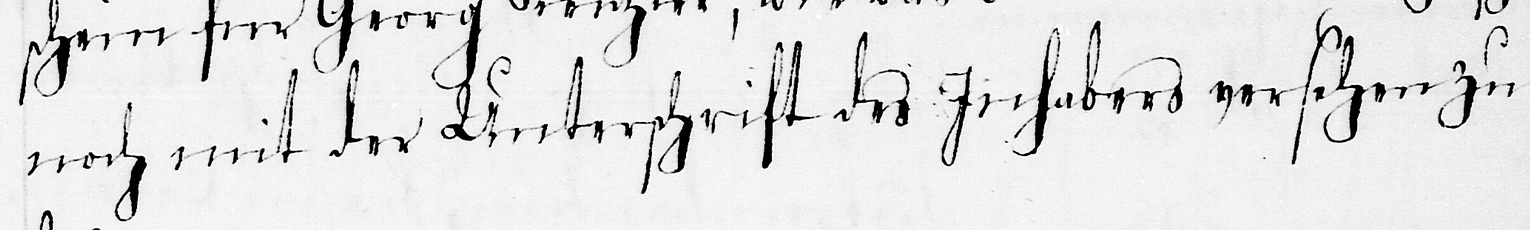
noch mit der Unterschrift des Inhabers versehen zu
